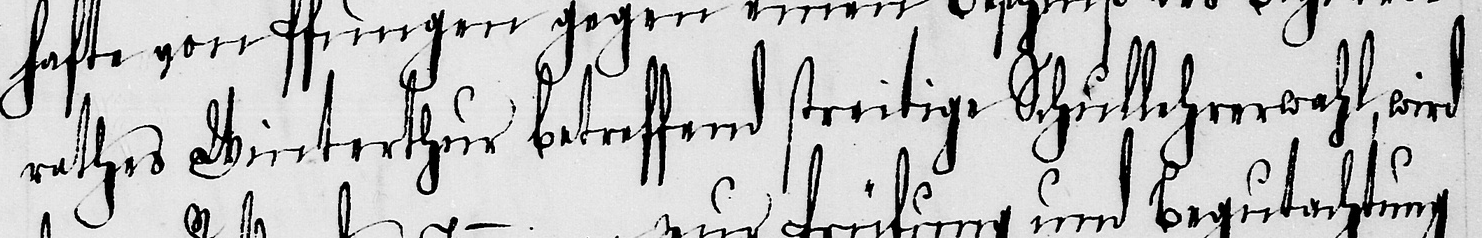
rathes Winterthur betreffend streitige Schullehrerwahl, wi¬
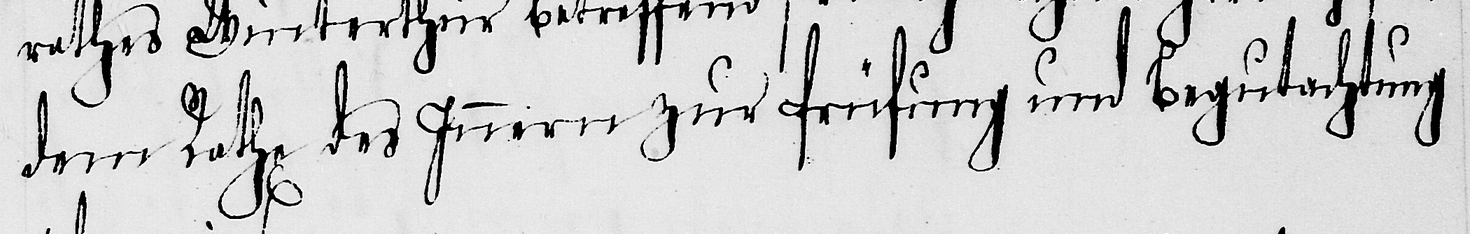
dem Rathe des Innern zur Prüfung und Begutachtung
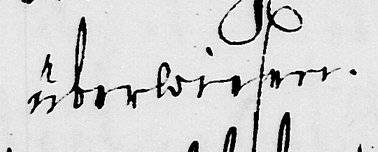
überwiesen.
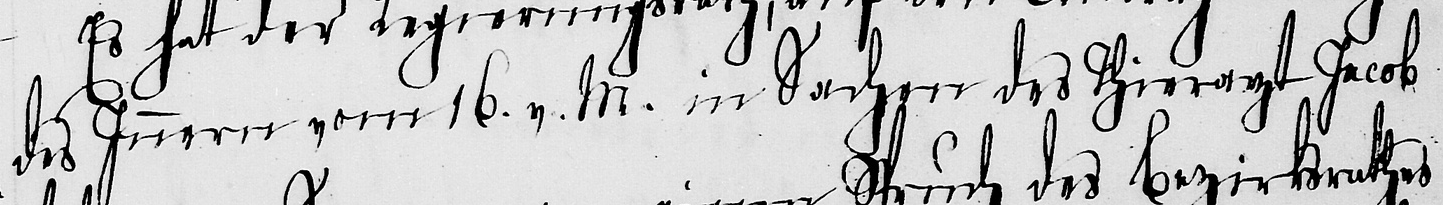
des Innern vom 16. v. M. in Sachen des Thierarzt Jacob
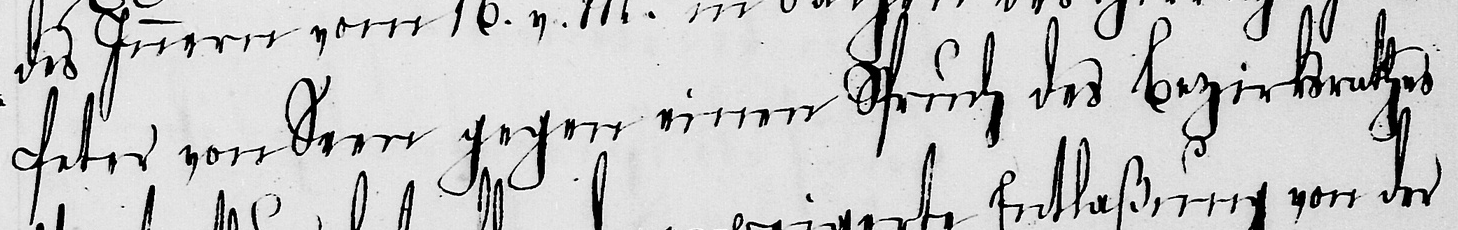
Peter von Seen gegen einen Spruch des Bezirksrathes
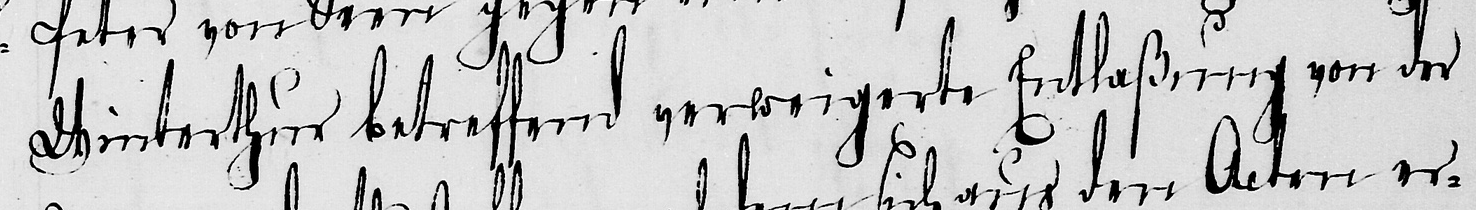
Winterthur betreffend verweigerte Entlaßung von der
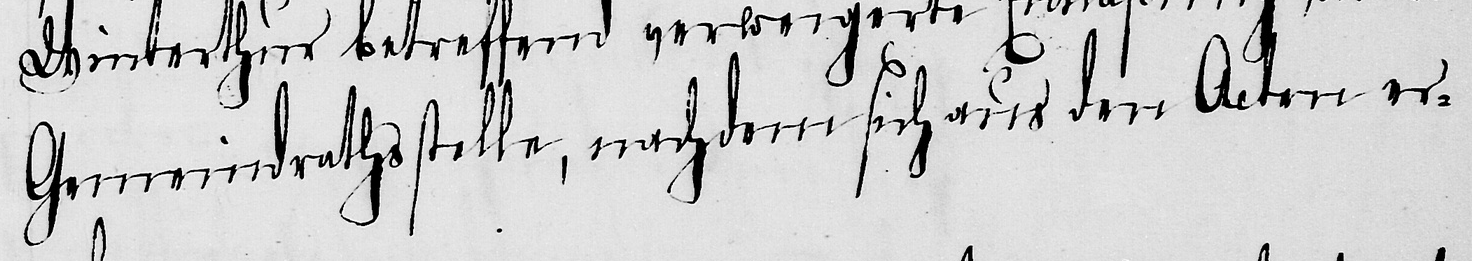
Gemeindrathsstelle, nachdem sich aus den Acten er¬
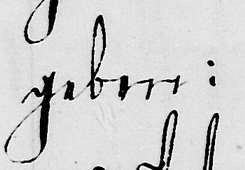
geben:
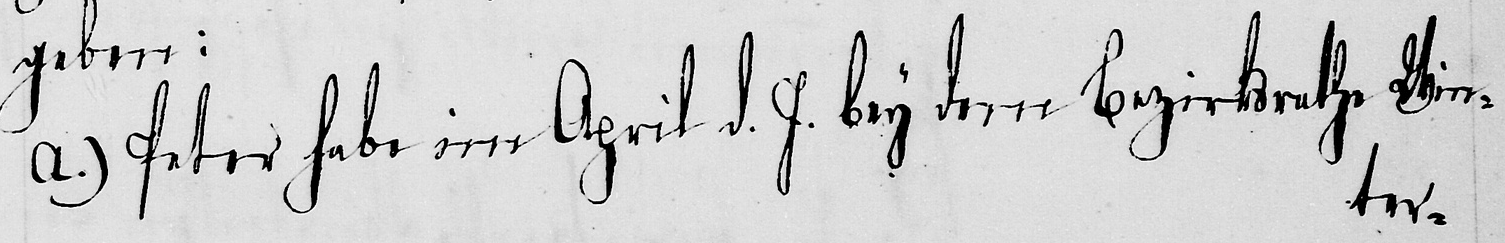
A.) Peter habe im April d. J. bey dem Bezirksrathe Win-
